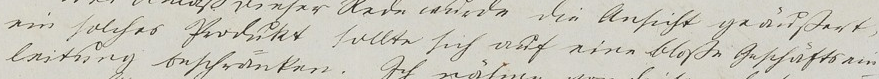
ein solches Produkt sollte sich auf eine bloße Geschäftsein-
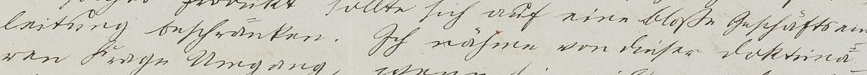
leitung beschränken. Ich nähme von dieser doktrinä-
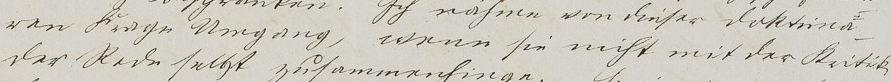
ren Frage Umgang, wenn sie nicht mit der Kritik
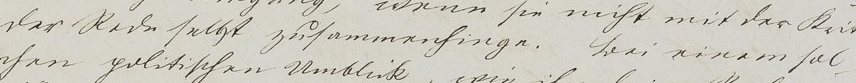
der Rede selbst zusammenhinge. Bei einem sol-
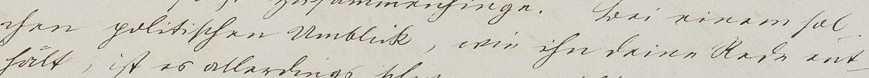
chen politischen Umblick, wie ihn deine Rede ent-
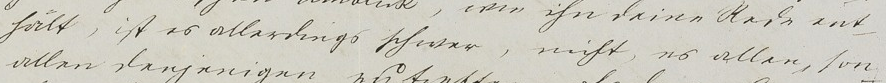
hält, ist es allerdings schwer, nicht, es allen, son-
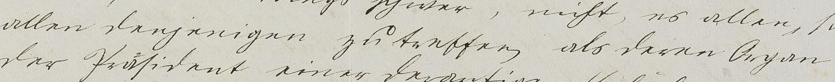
allen denjenigen zu treffen, als deren Organ
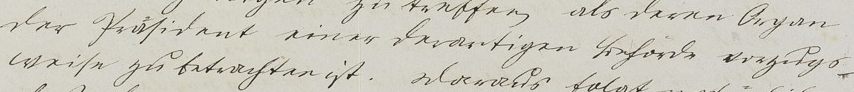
der Präsident einer derartigen Behörde vorzugs-
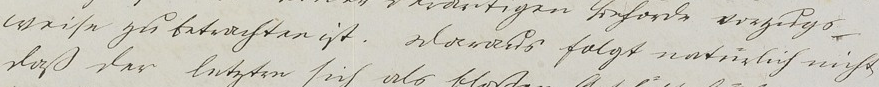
weise zu betrachten ist. Daraus folgt natürlich nicht,
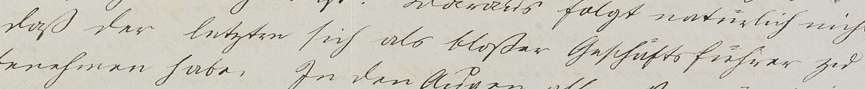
daß der letztre sich als bloßer Geschäftsführer zu
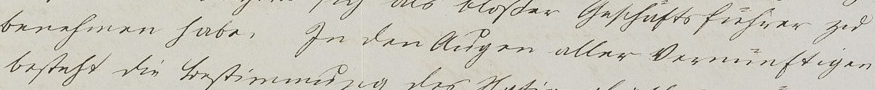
benehmen habe. In den Augen aller Vernünftigen
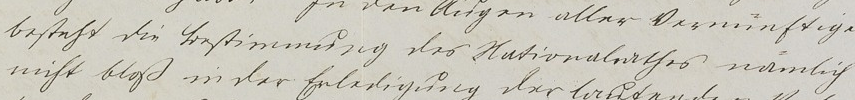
besteht die Bestimmung des Nationalrathes nämlich
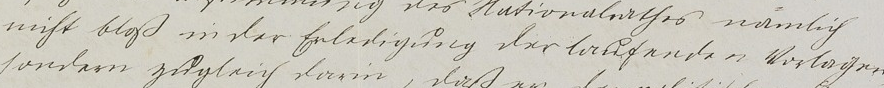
nicht bloß in der Erledigung der laufenden Vorlagen,
